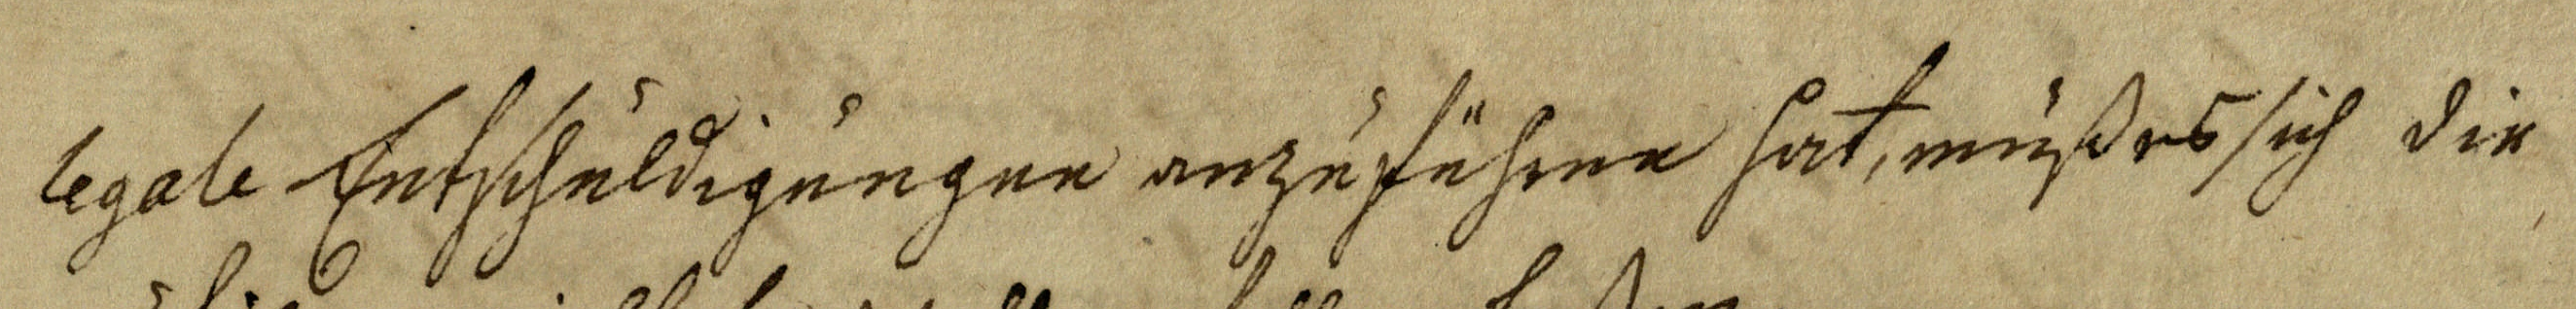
legale Entschuldigungen anzuführen hat, muß er sich die
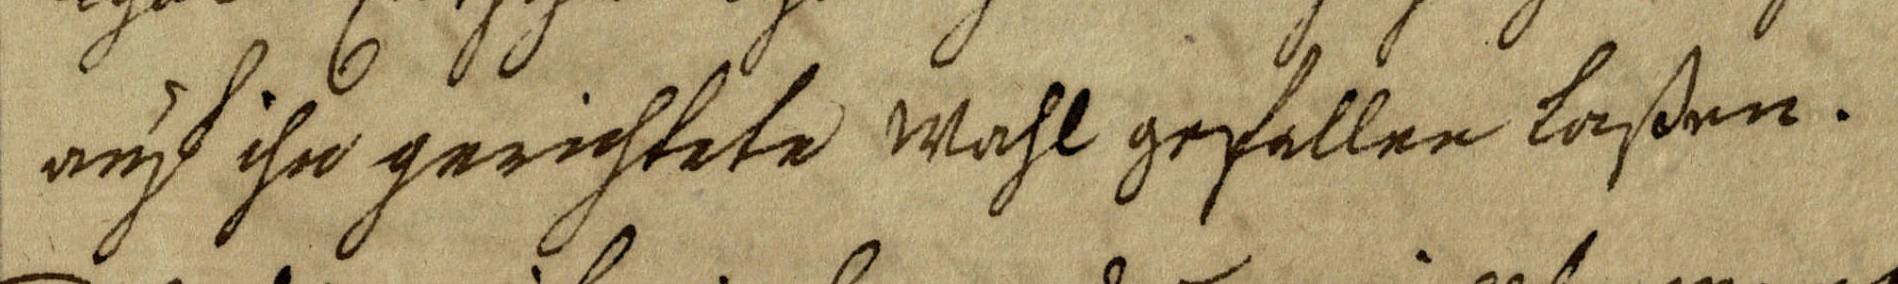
auf ihn gerichtete Wahl gefallen laßen.
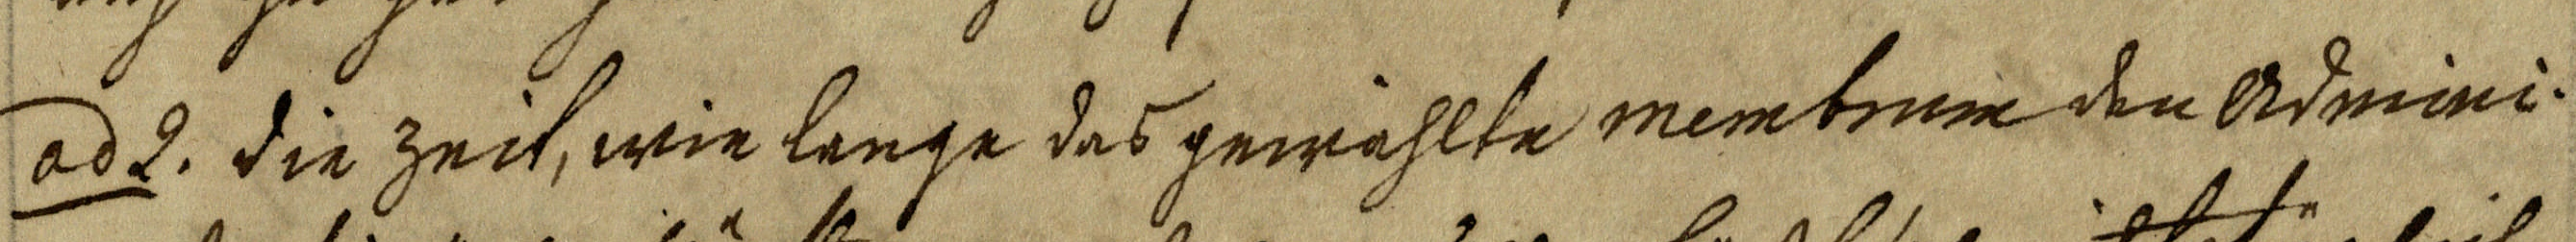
ad. 2. die Zeit, wie lange das gewählte membrum den Admini¬
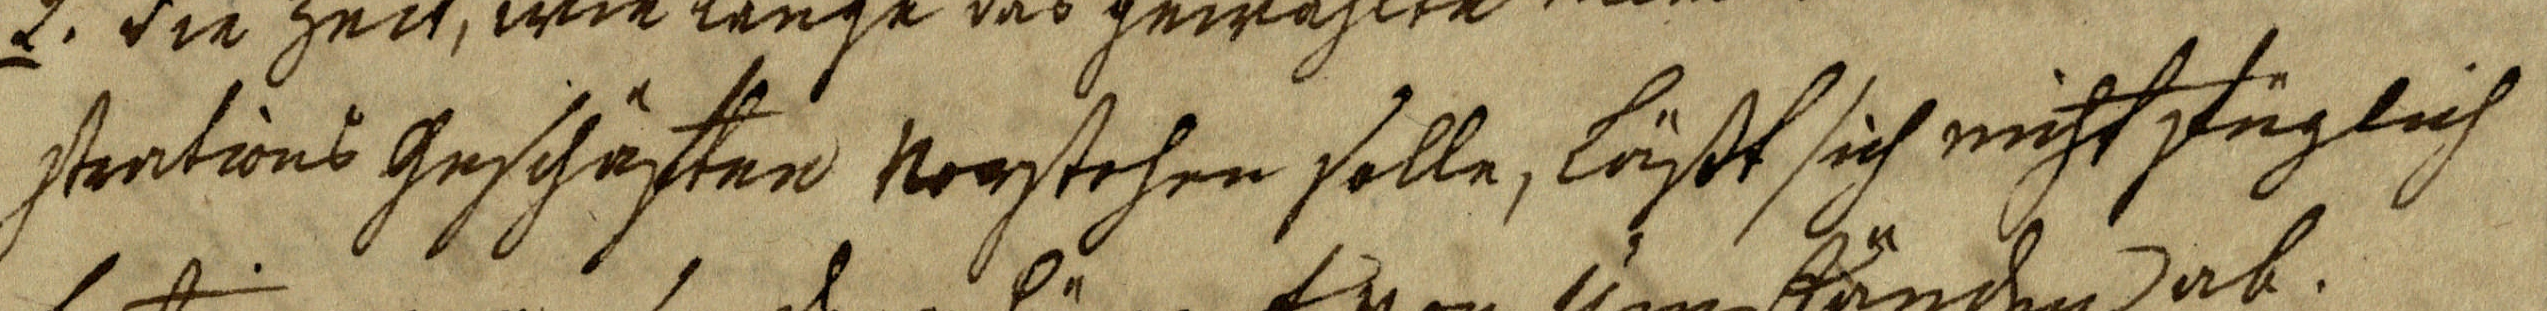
strations Geschäften vorstehen solle, länßt sich nicht füglich
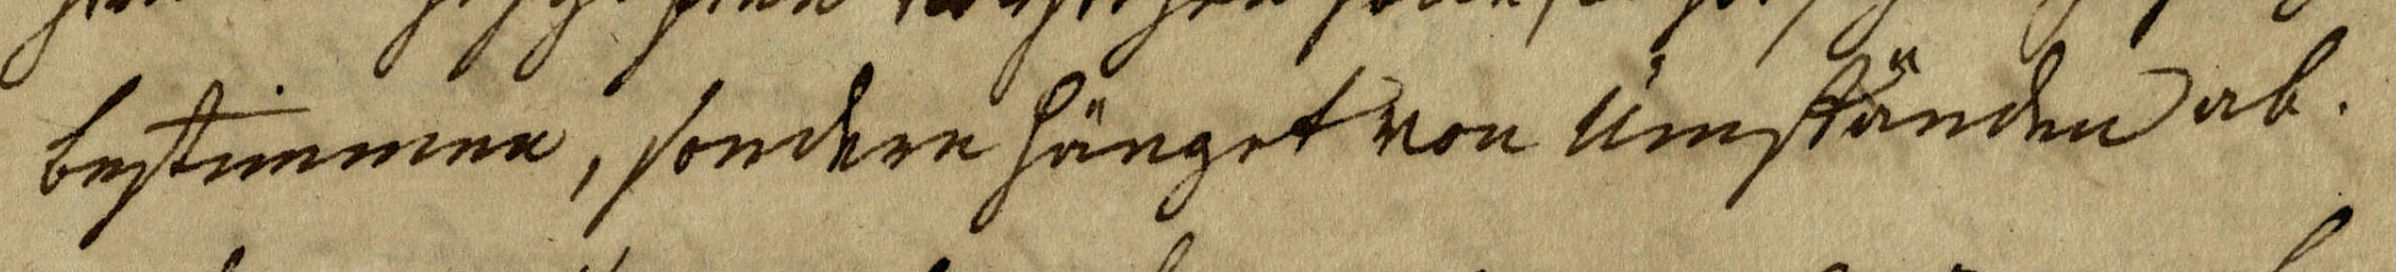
bestimmen, sondern hänget von Umständen ab.
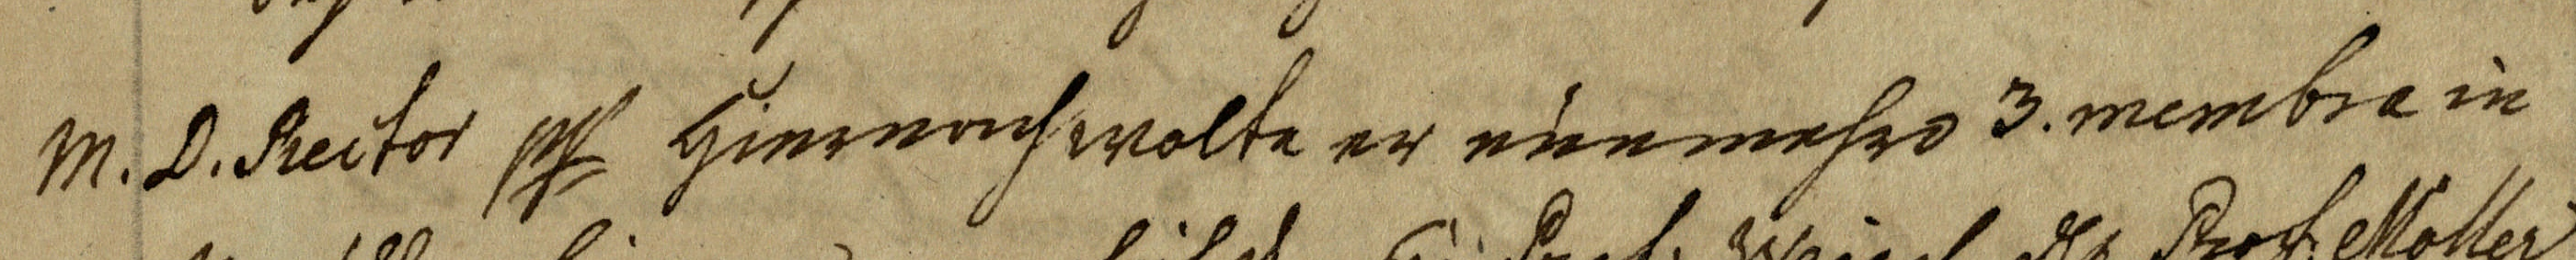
M. D. Rector pp Hiernach wolte er nunmehro 3 membra in
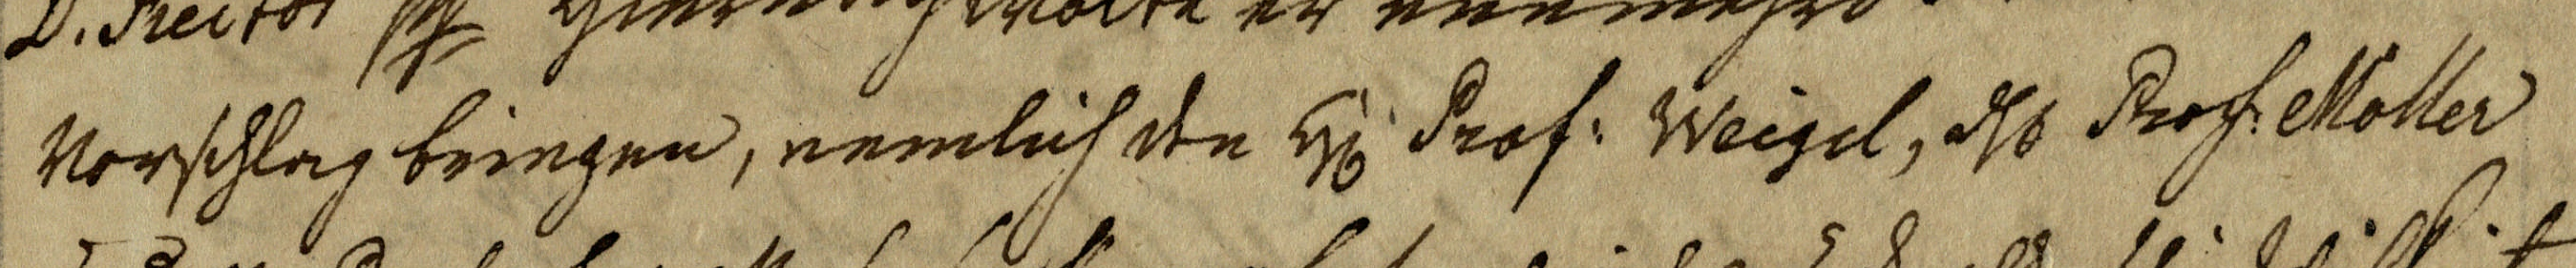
Vorschlag bringen, nemlich den H Prof. Weigel, dh Prof. Möller
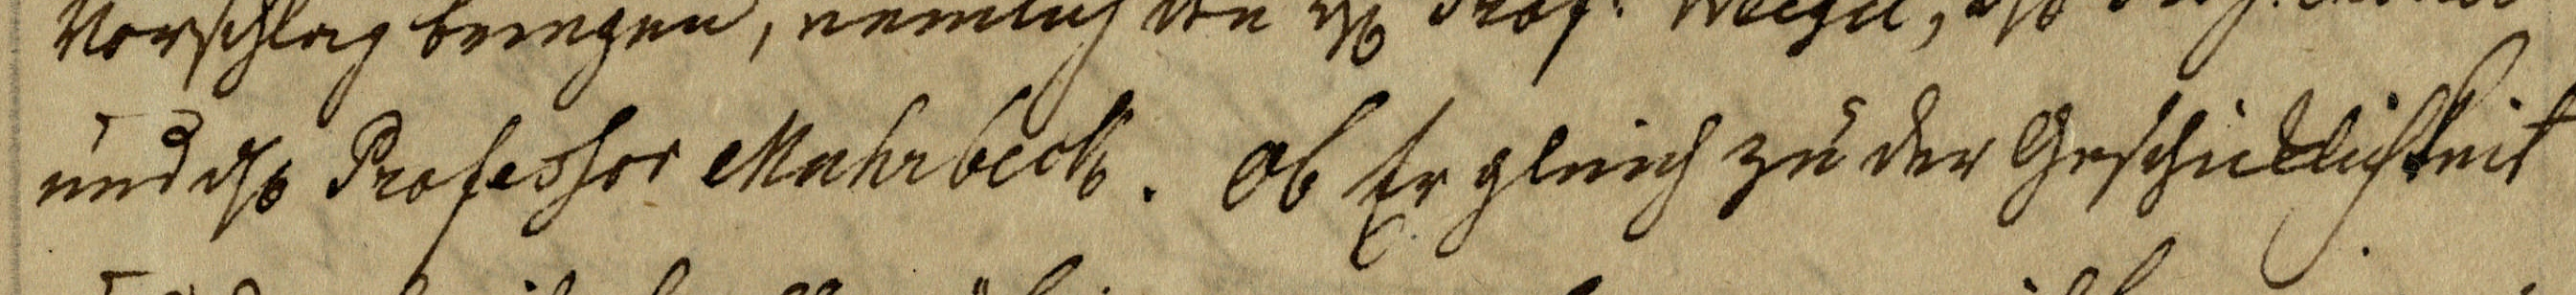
und dh Professor Muhrbeck. ob Er gleich zu der Geschicklichkeit
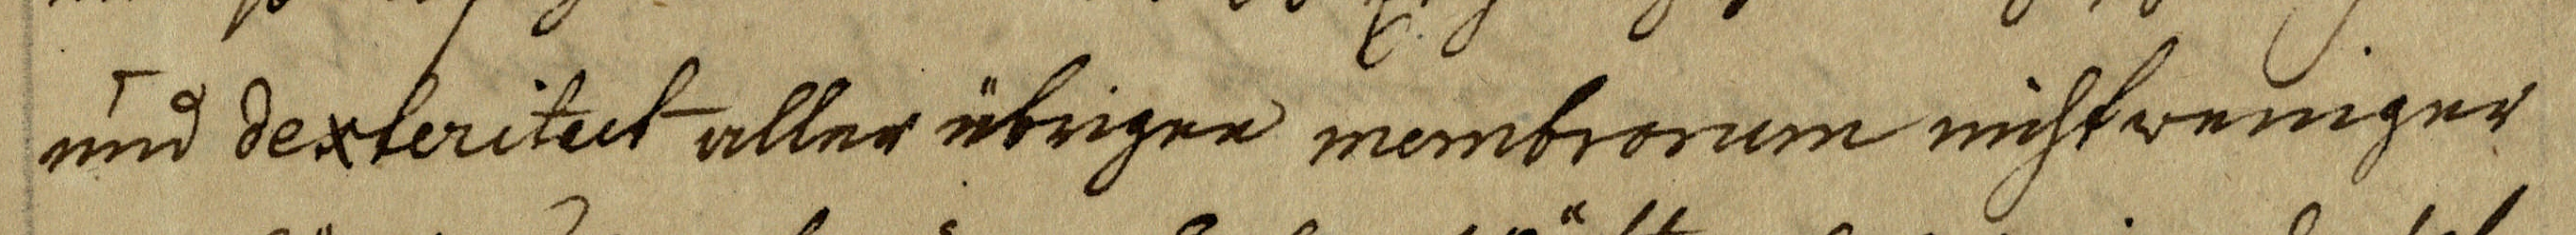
und dexteritaet aller übrigen membrorum nicht weniger
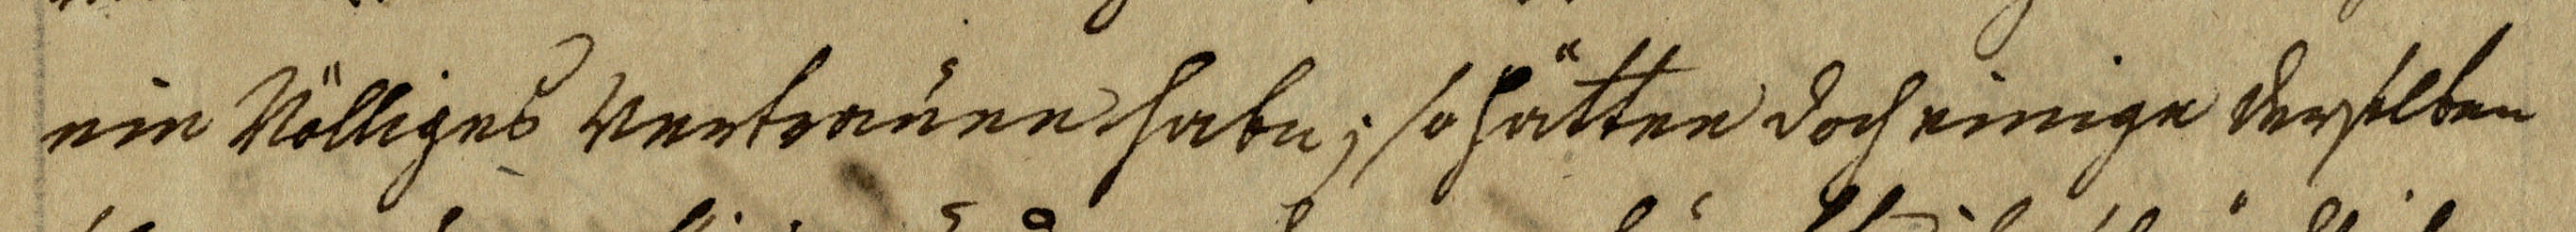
ein Völliges Vertrauen habe, so hätten doch einige derselben
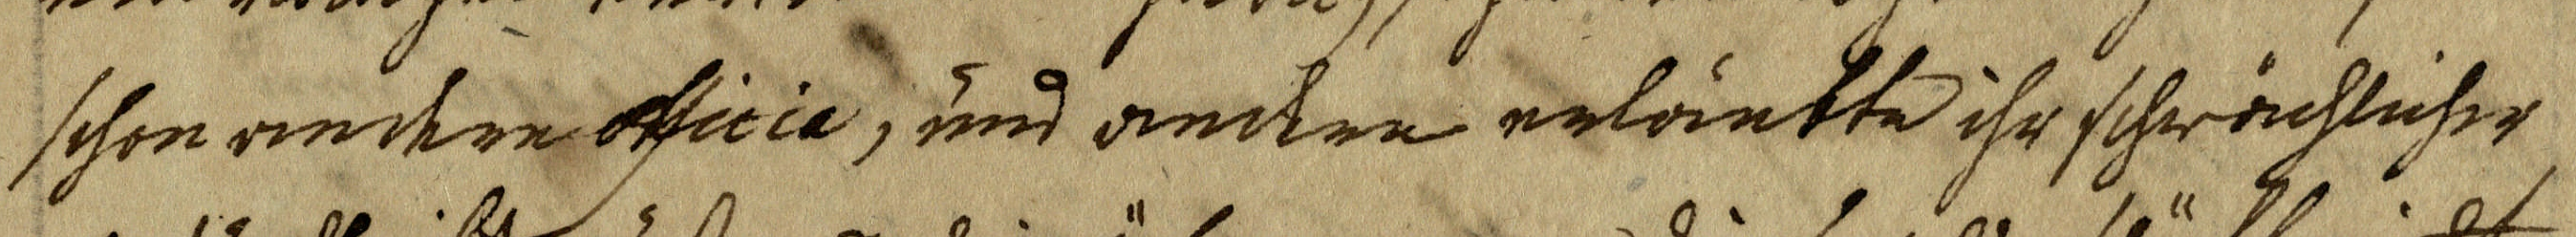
schon andere officia, und andern erlaubte ihr schwächlicher
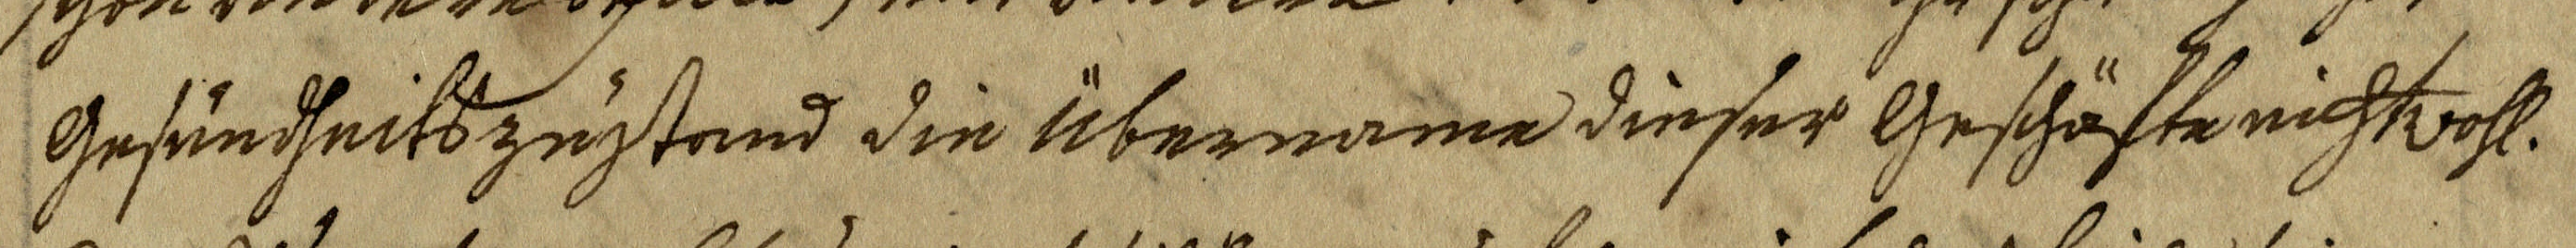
Gesundheitszustand die Übername dieser Geschäfte nichtwohl.
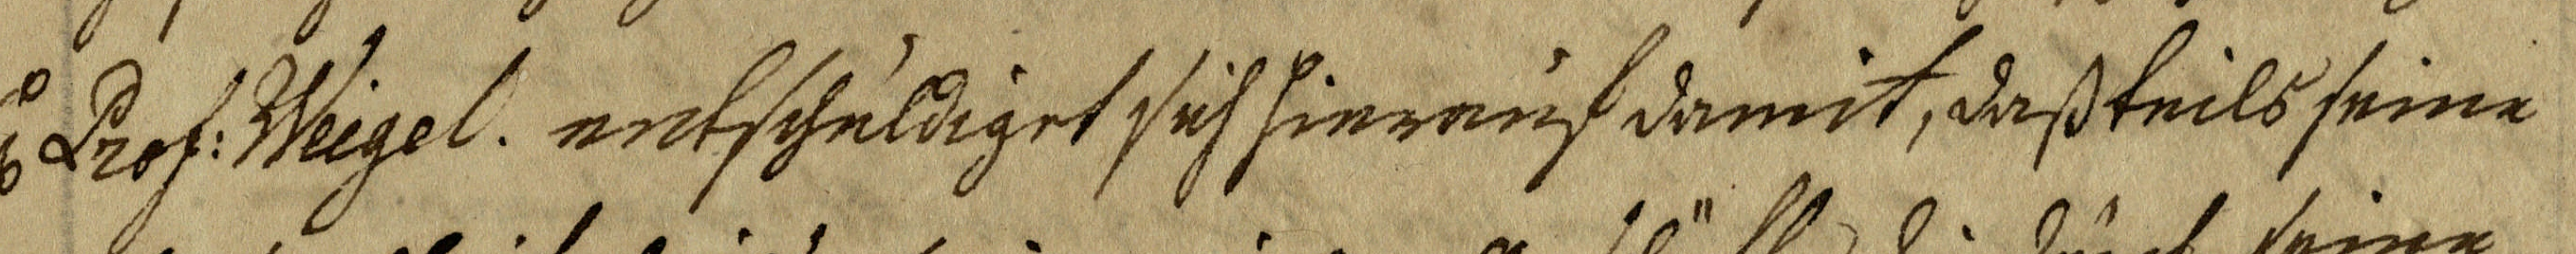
dh Prof Weigel. entschuldiget sich hierauf damit, daß teils seine
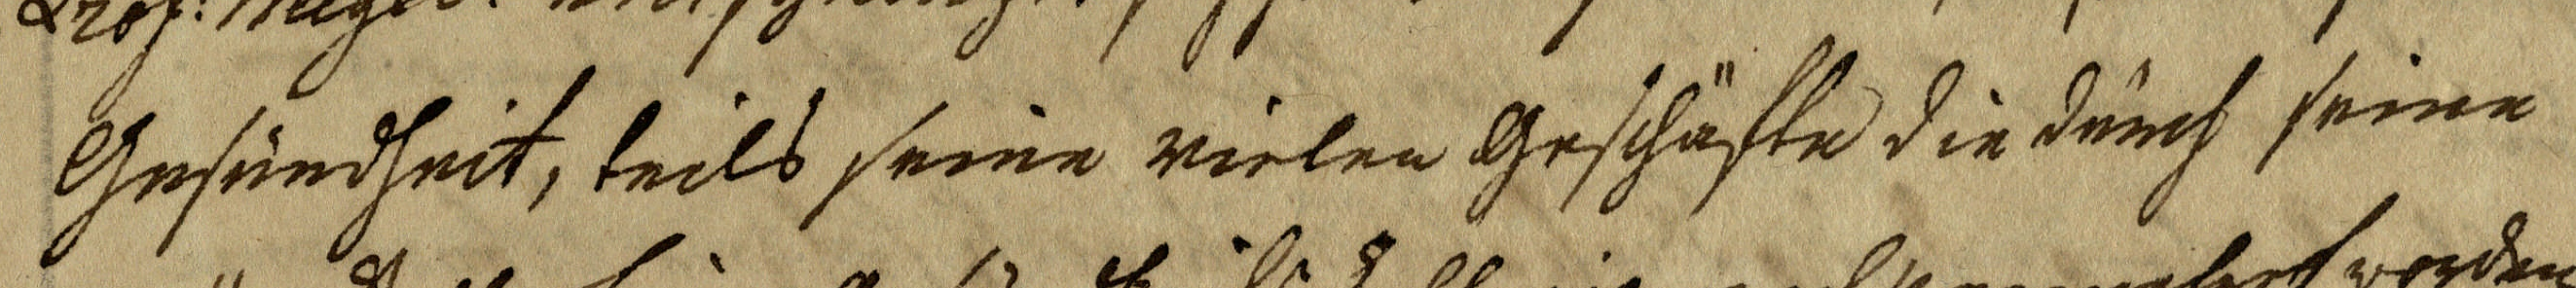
Gesundheit, teils seine vielen Geschäfte die durch seine
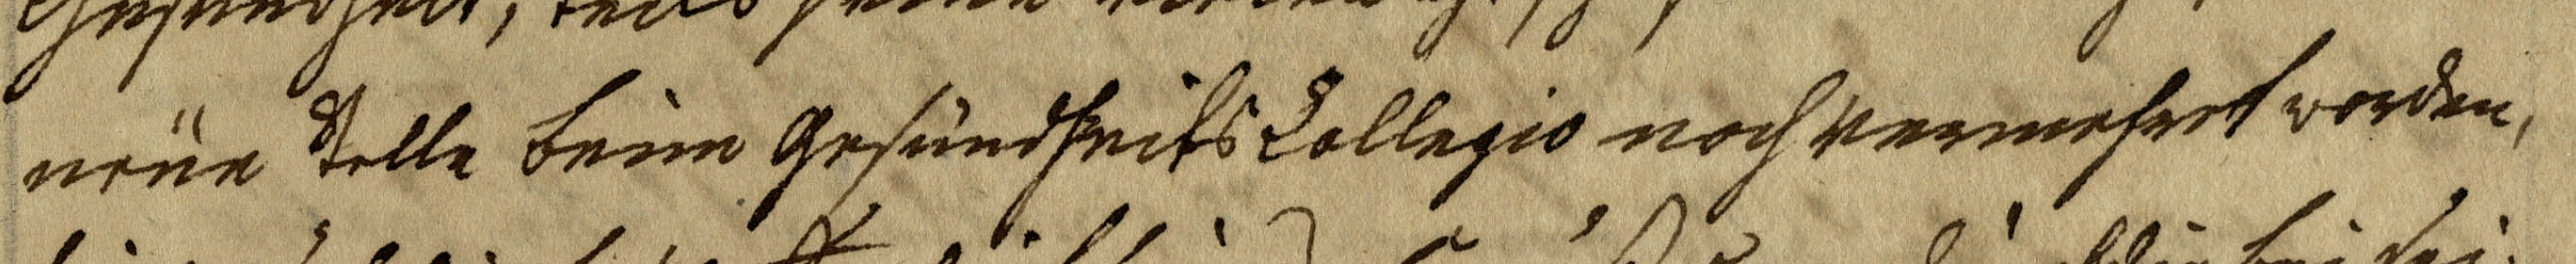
neue Stelle beim Gesundheits Collegio noch vermehret worden,
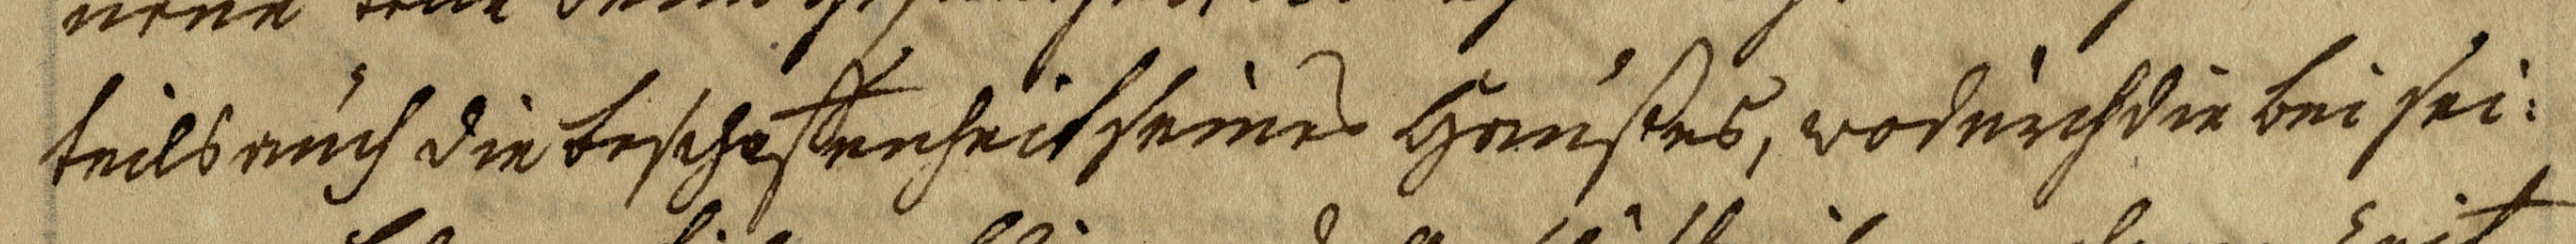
teils auch die Beschaffenheit seines Haußes, wodurch die bei sei¬
